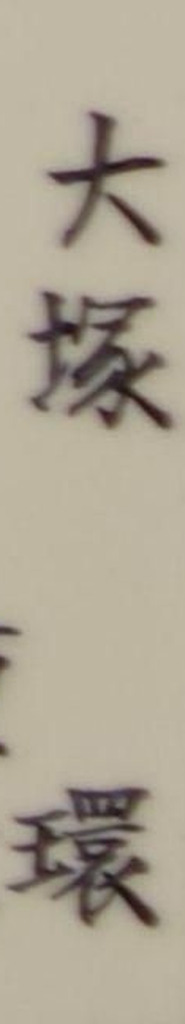大塚環
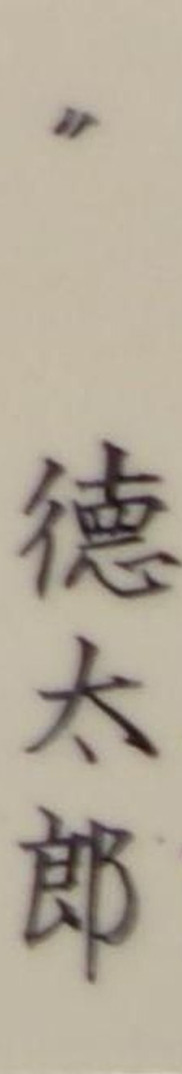徳太郎
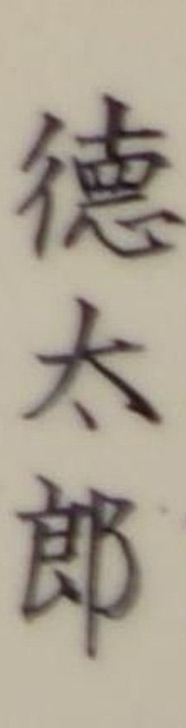徳太郎
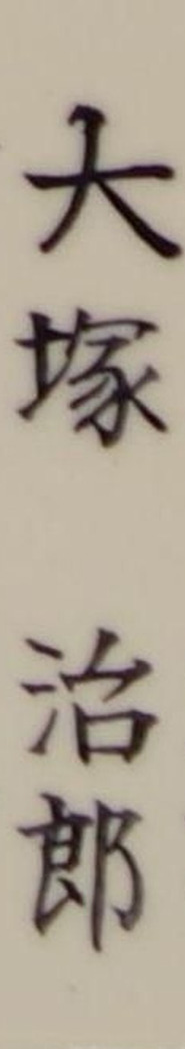大塚治郎
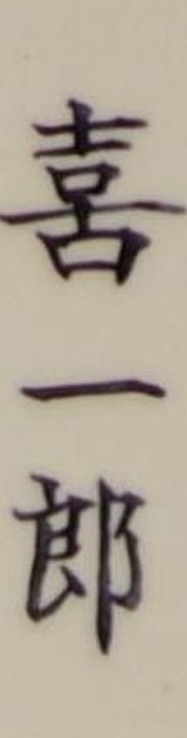喜一郎
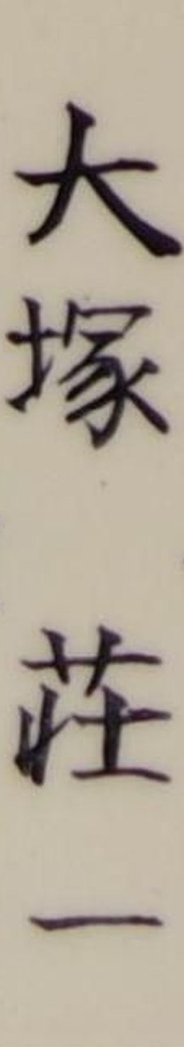大塚荘一
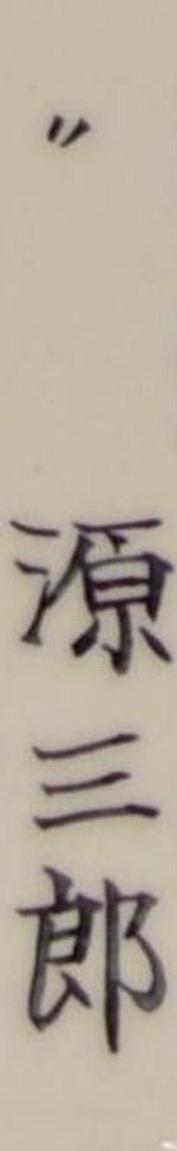源三郎
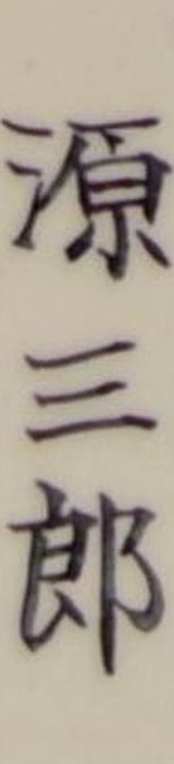源三郎
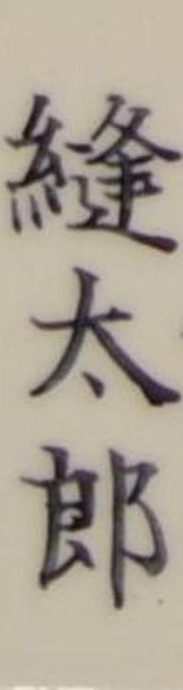縫太郎
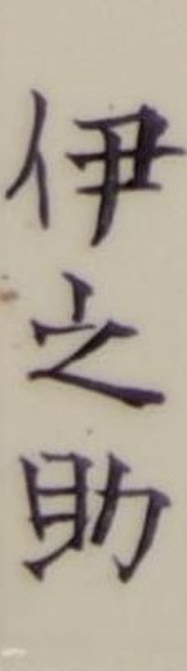伊之助

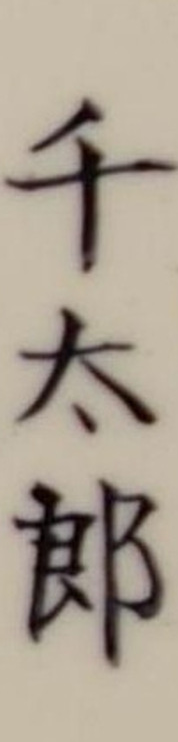千太郎
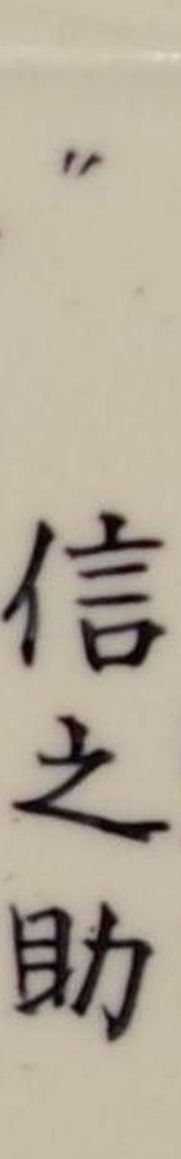信之助
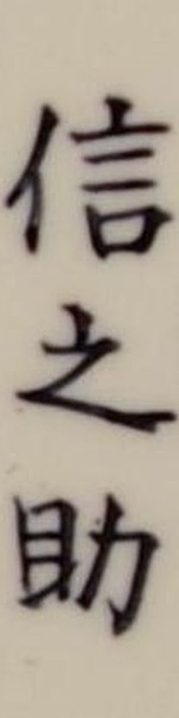信之助
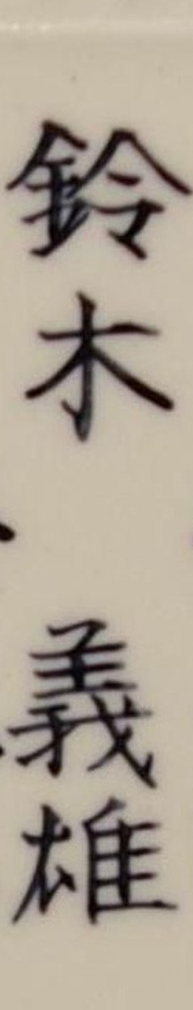鈴木義雄
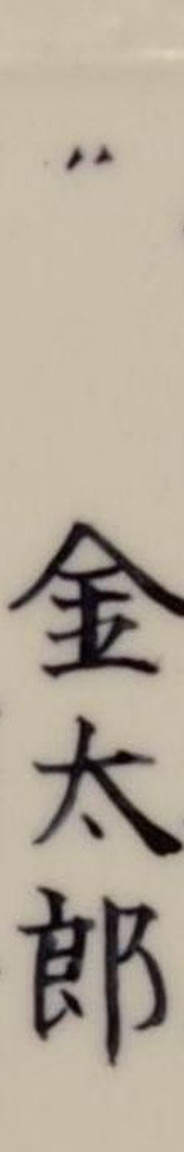金太郎
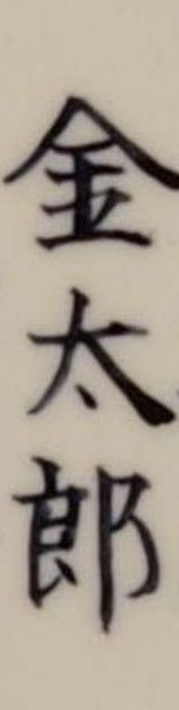金太郎
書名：M~S
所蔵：高野山金剛峯寺
